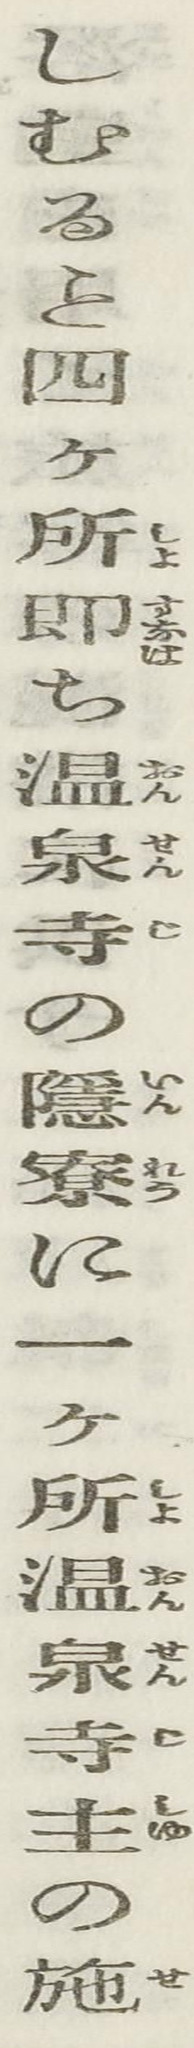しむること四ヶ所即ち温泉寺の陰寮に一ヶ所温泉寺主の施
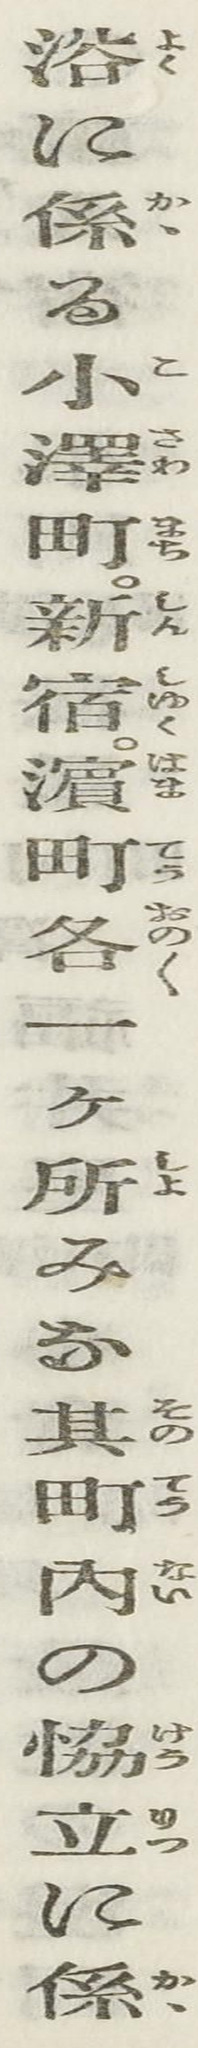浴に係る小澤町。新宿。浜町各一ヶ所みな其町内の協立に係
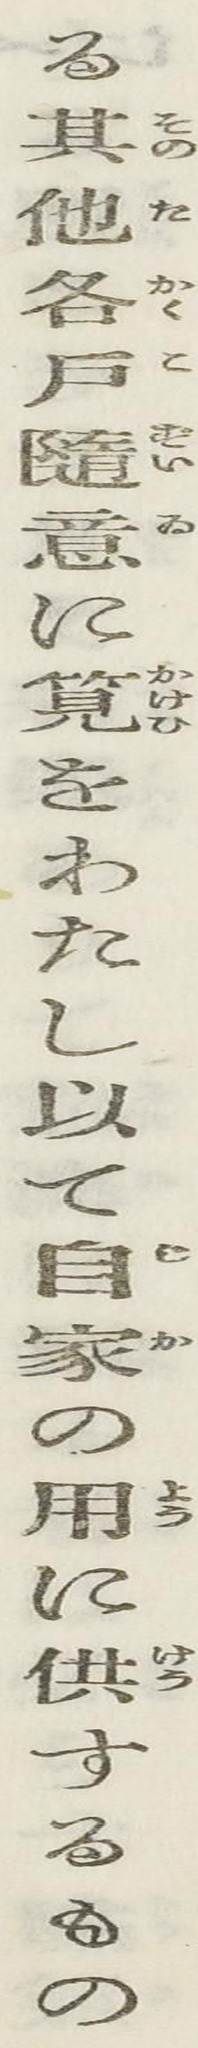る其他各戸随意に筧をわたし以て自家の用に供するもの
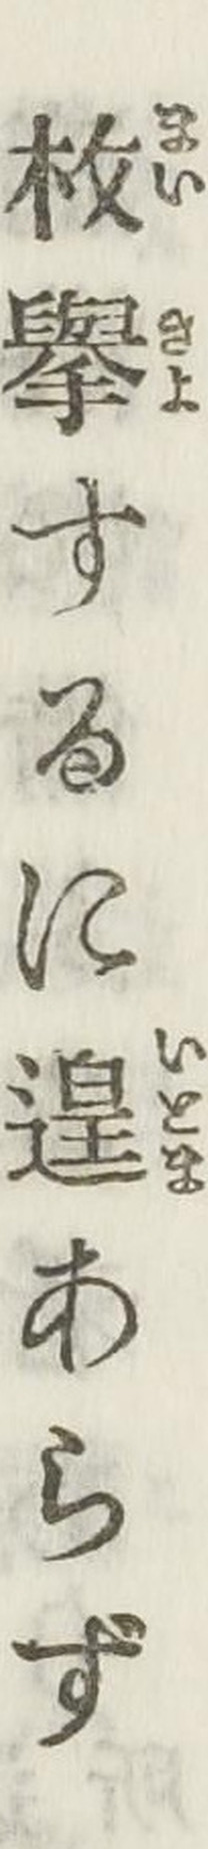枚挙するに遑あらず
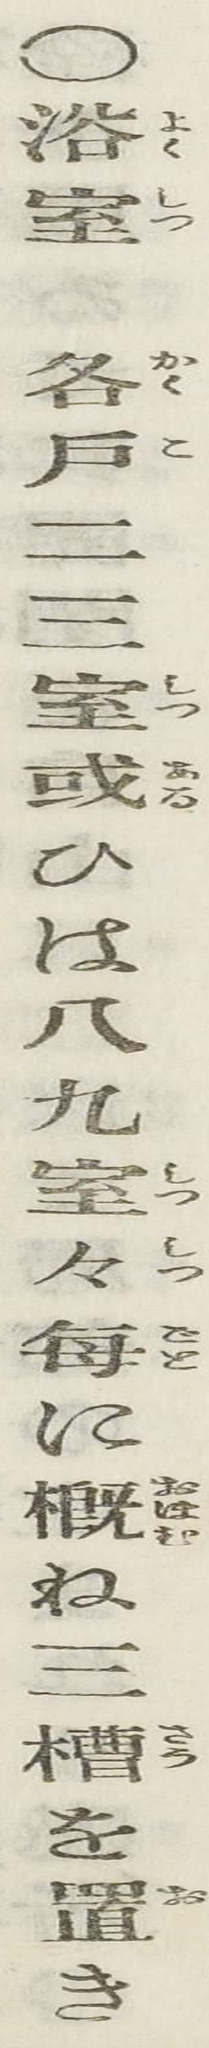○浴室各戸二三室或ひは八九室々毎に概ね三槽を置き
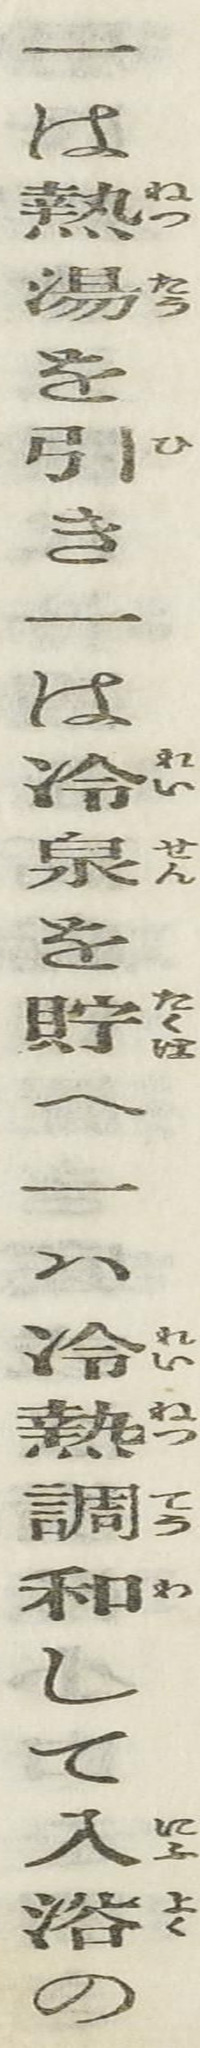一は熱湯を引き一は冷泉を貯へ一は冷熱調和して入浴の

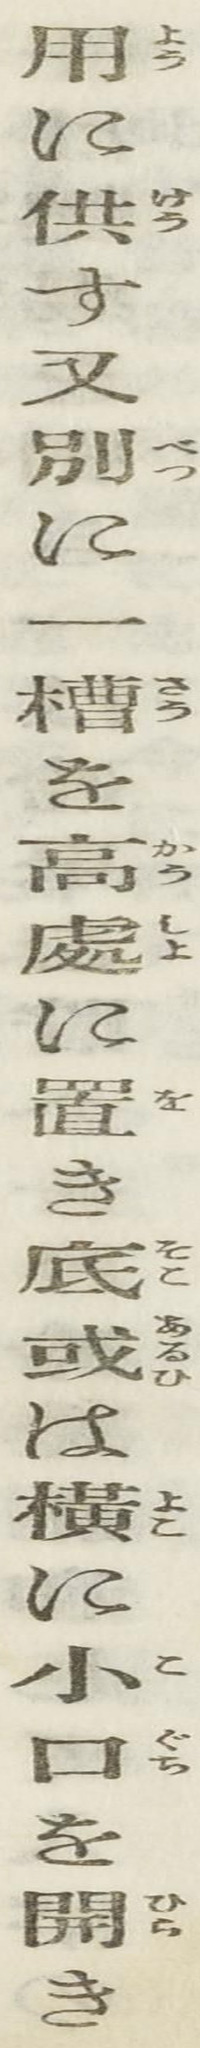用に供す又別に一槽を高處に置き底或は横に小口を開き
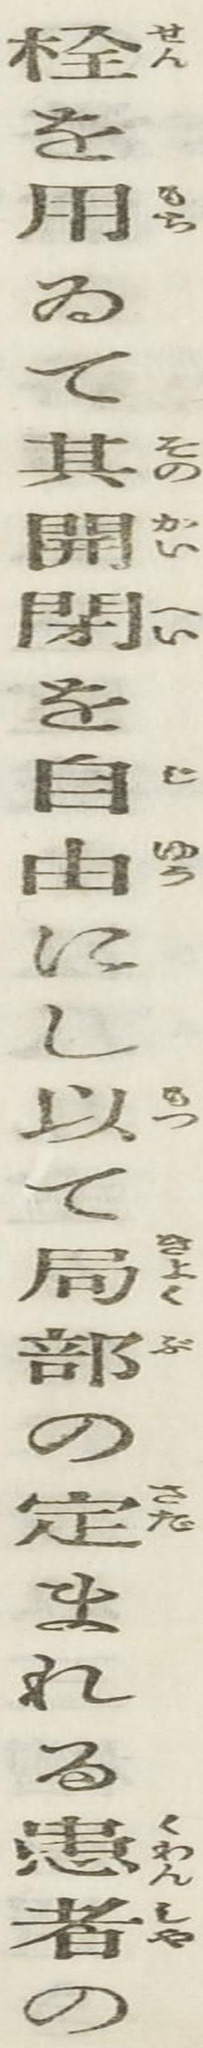栓を用ゐて其開閉を自由にし以て局部の定まれる患者の
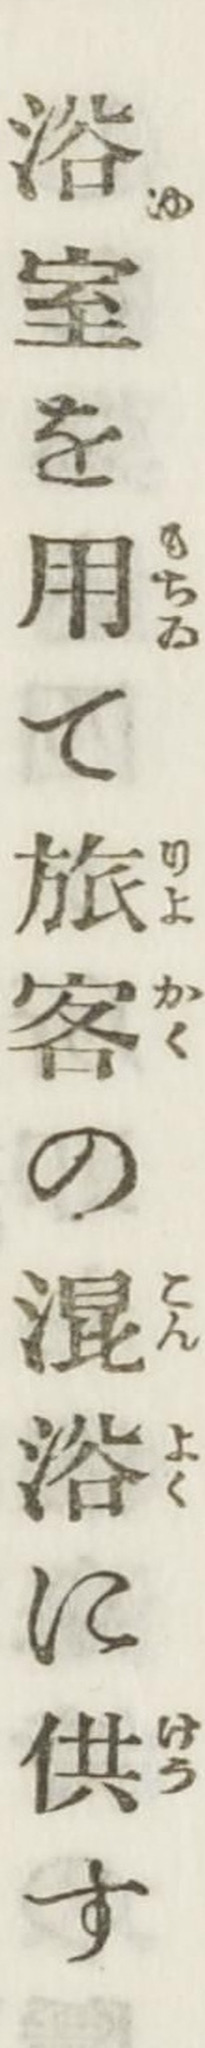浴室を用て旅客の混浴に供す
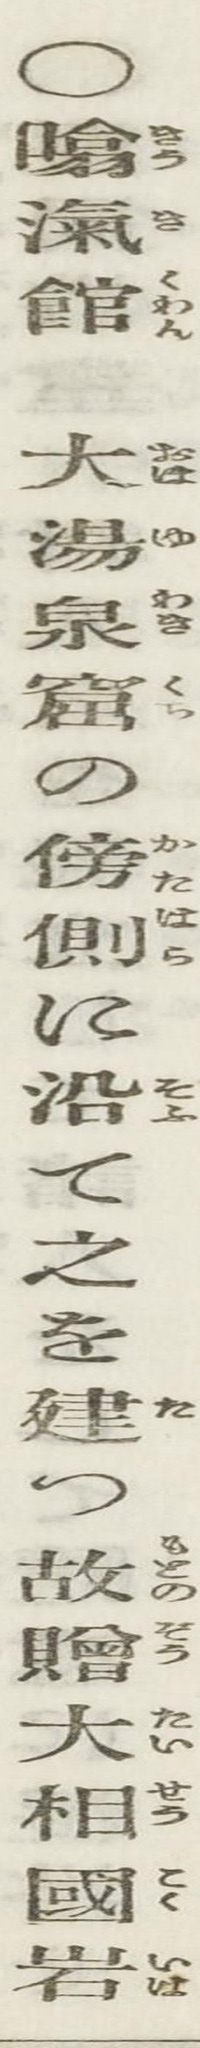○噏滊館大湯泉窟の傍側に沿て之を建つ故大相國岩
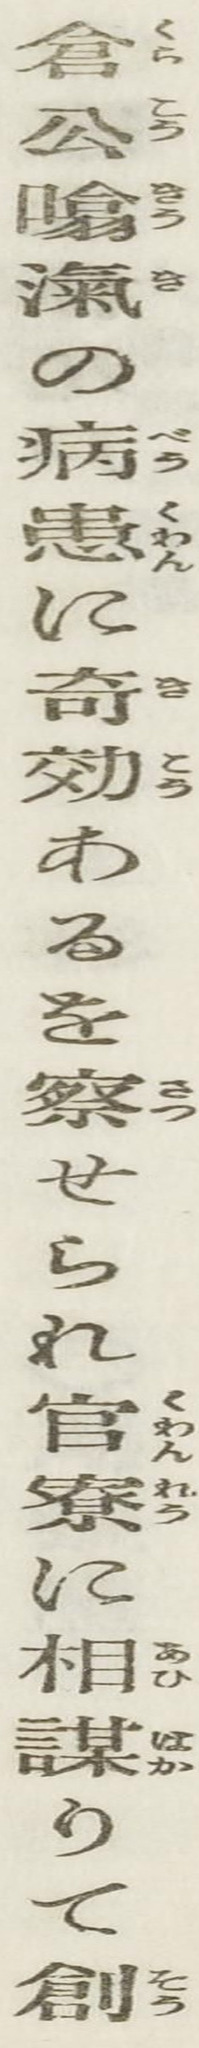倉公噏滊の病患に奇効あるを察せられ官寮に相謀りて創
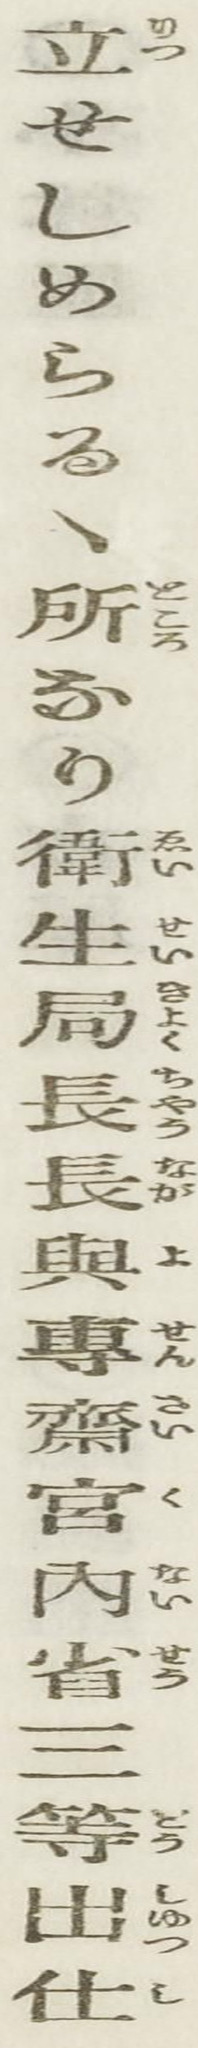立せしめらるゝ所なり衛生局長長與専齋宮内省三等出仕
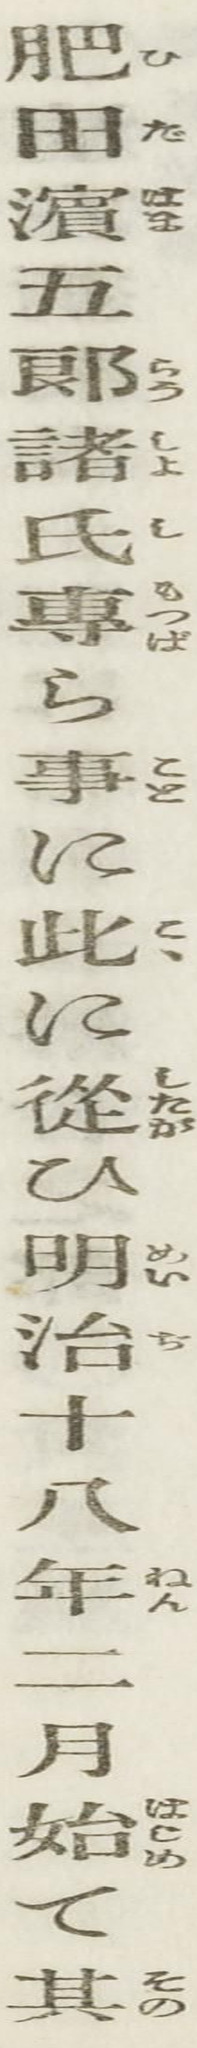肥田濱五郎諸氏専ら事に此に従ひ明治十八年二月始て其
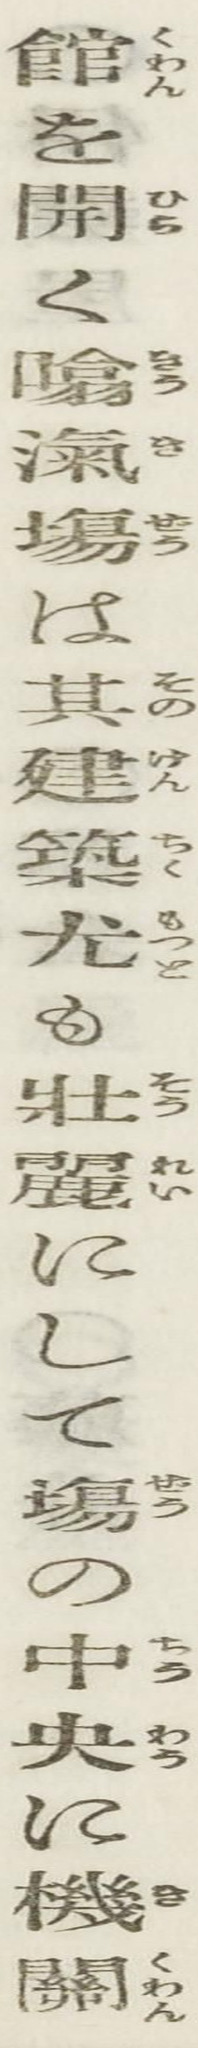館を開く噏滊場は其建築尤も壮麗にして場の中央に機関
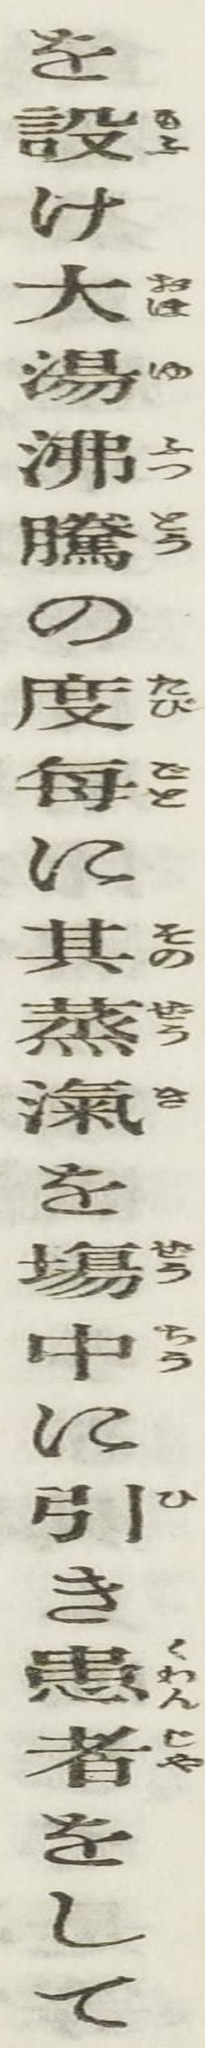を設け大湯沸騰の度毎に其蒸滊を場中に引き患者をして
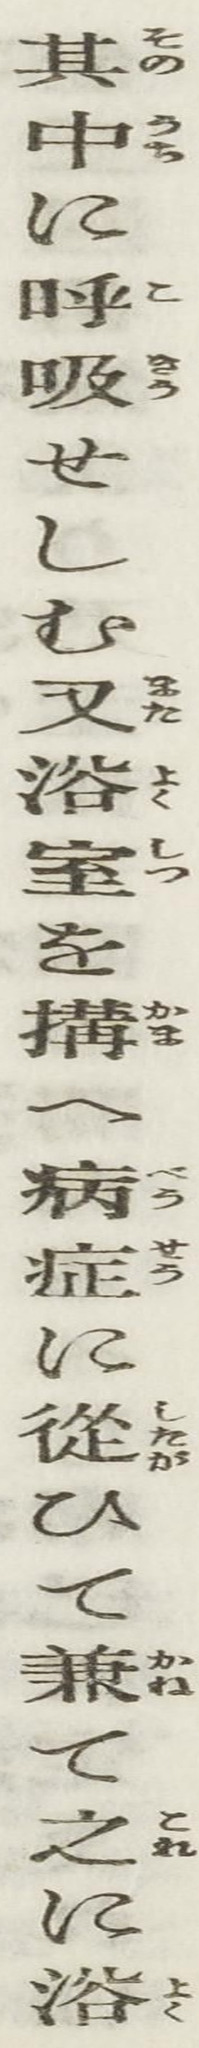其中に呼吸せしむ又浴室を構へ病症に従ひて兼て之に浴
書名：熱海獨案内　全
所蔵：東京大学地震研究所図書室 Earthquake Research Institute Library, The University of Tokyo, JAPAN
